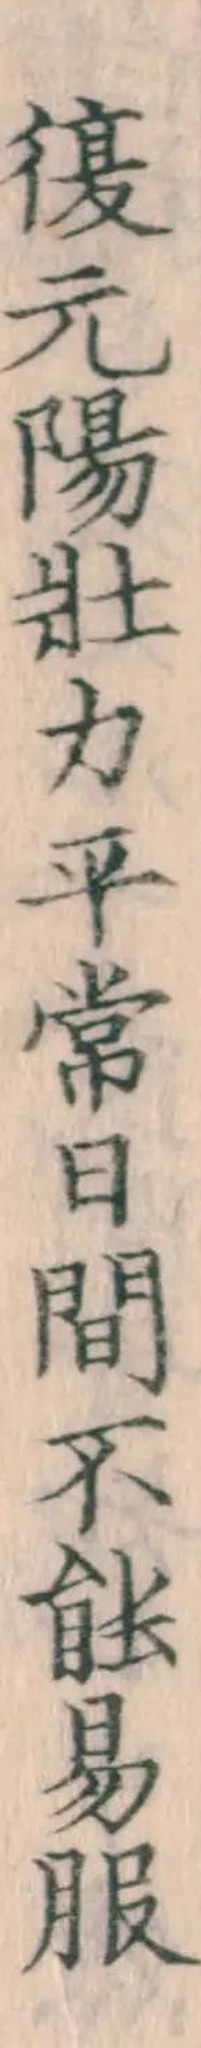復元陽壮力平常日間不能易服
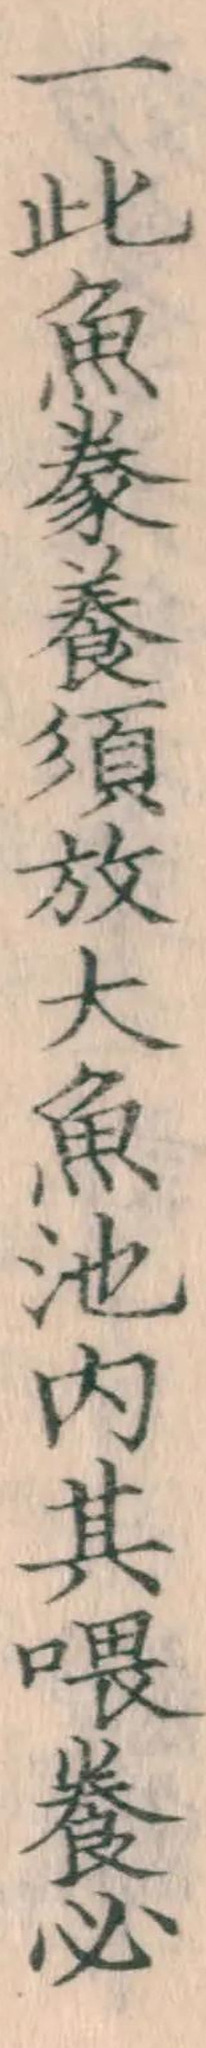一此魚豢養須放大魚池内其喂養必
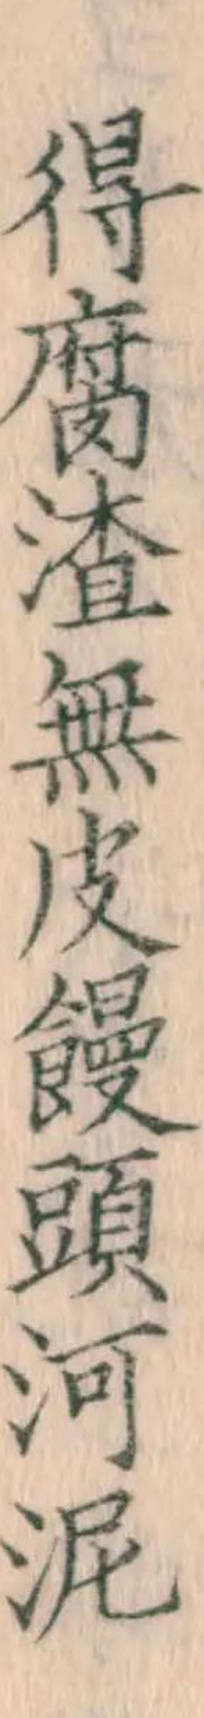得腐渣無皮饅頭河泥
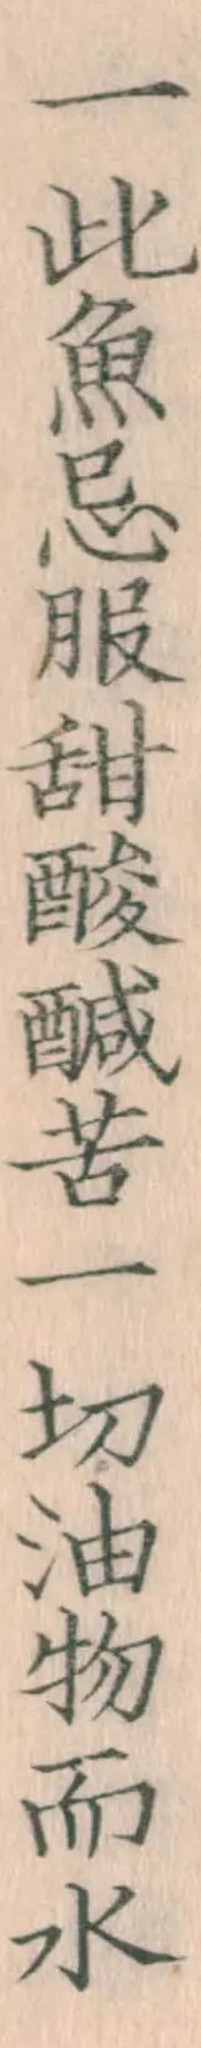一此魚忌服甜酸醎苦一切油物而水
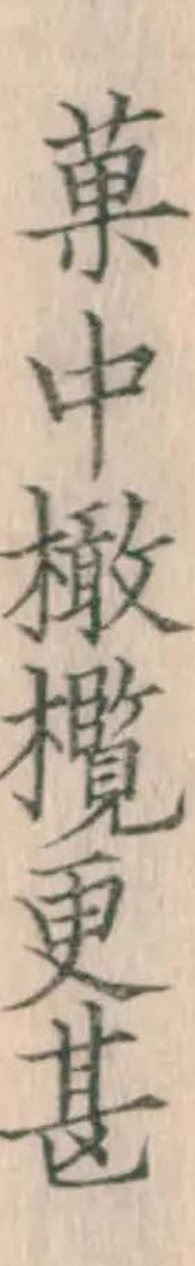菓中橄欖更甚
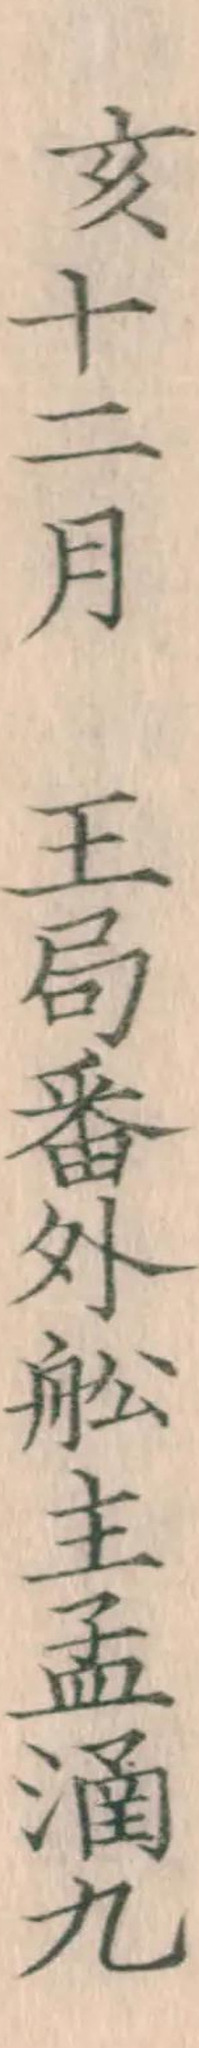亥十二月王局番外船主孟涵九
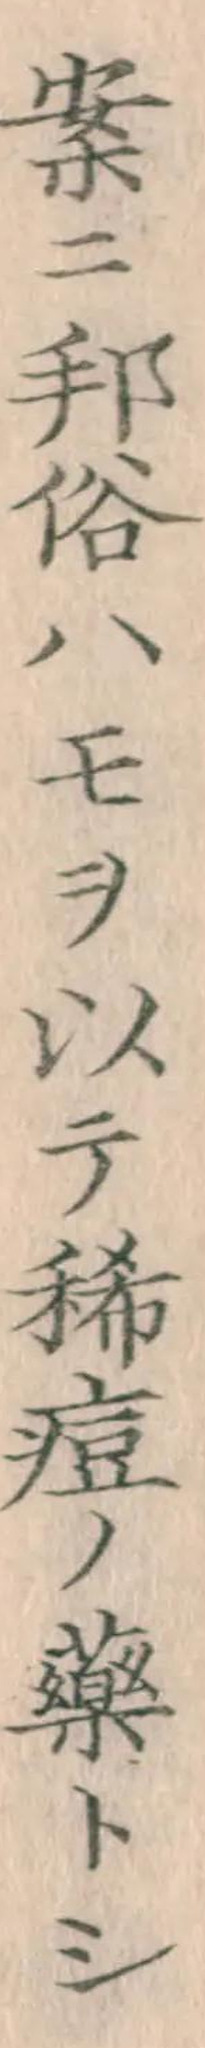案ニ邦俗ハモヲ以テ稀痘ノ薬トシ
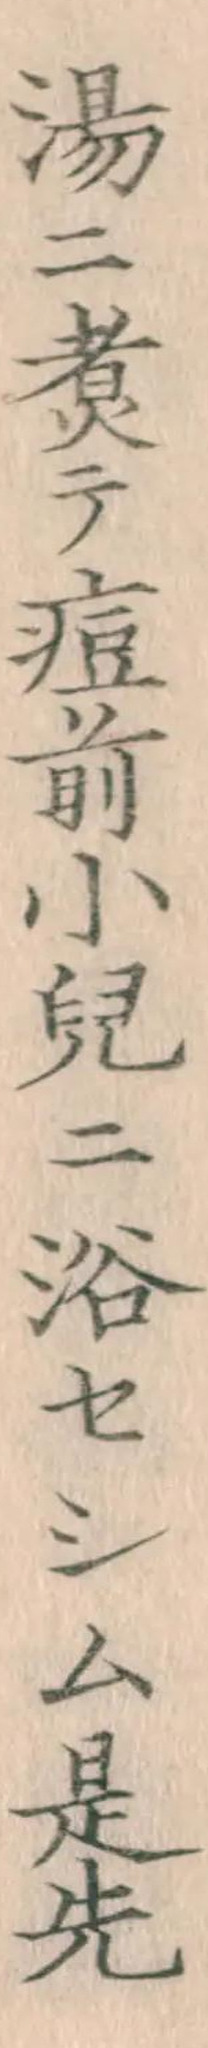湯ニ煮テ痘前小児ニ浴セシム是先
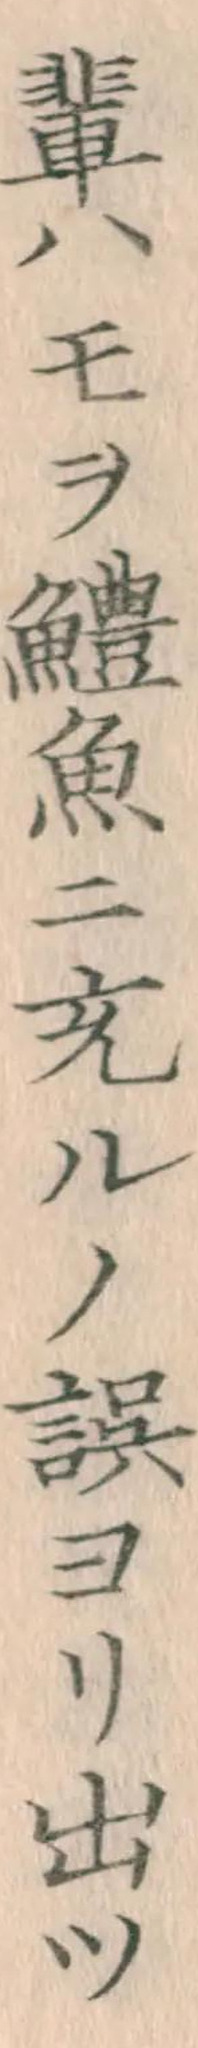輩ハモヲ鱧魚ニ充ルノ誤ヨリ出ツ
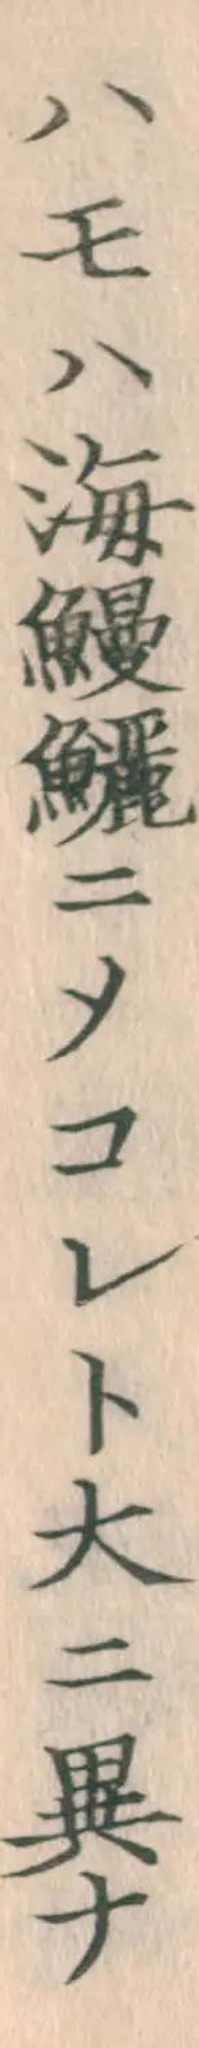ハモハ湖海鰻鱺ニシテコレト大ニ異ナ

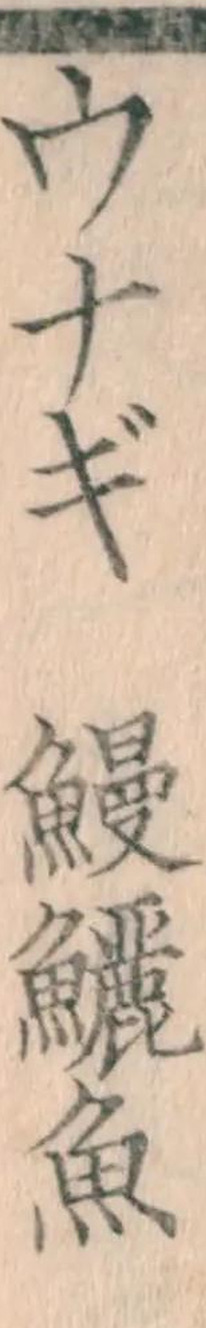ウナギ鰻鱺魚
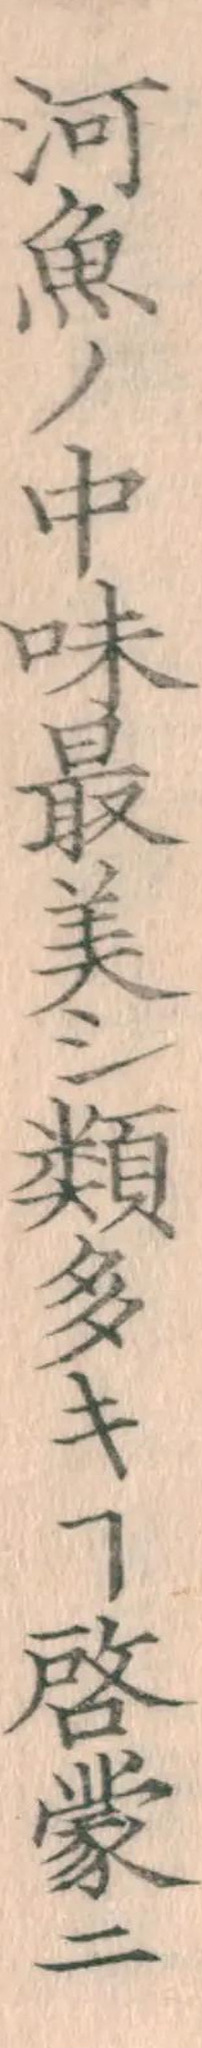河魚ノ中味最美シ類多キヿ啓蒙ニ
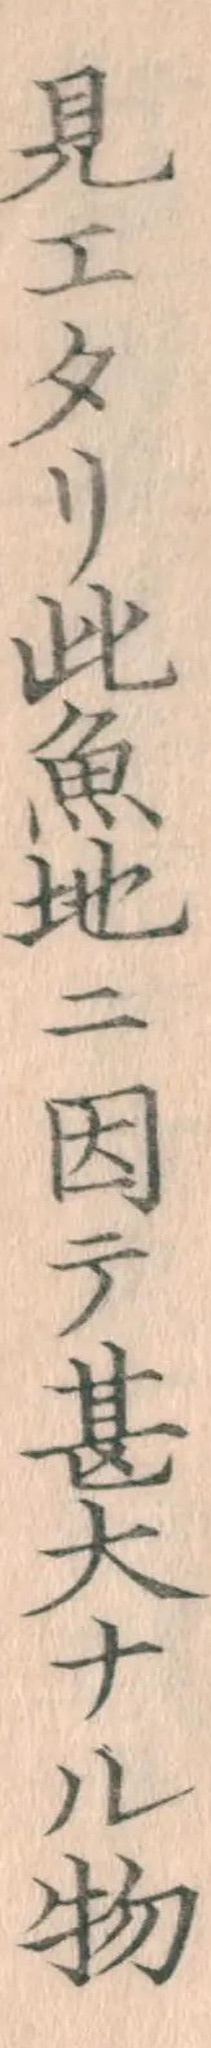見エタリ此魚地ニ因テ甚大ナル物
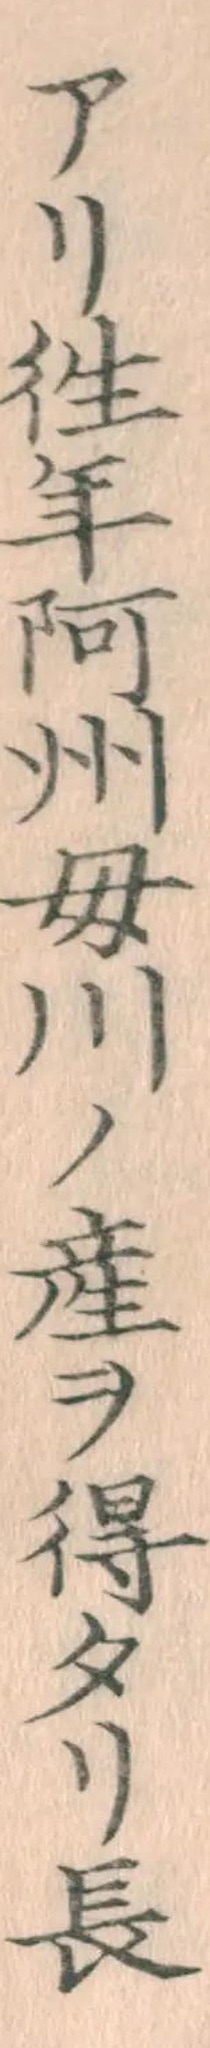アリ往年阿州母川ノ産ヲ得タリ長
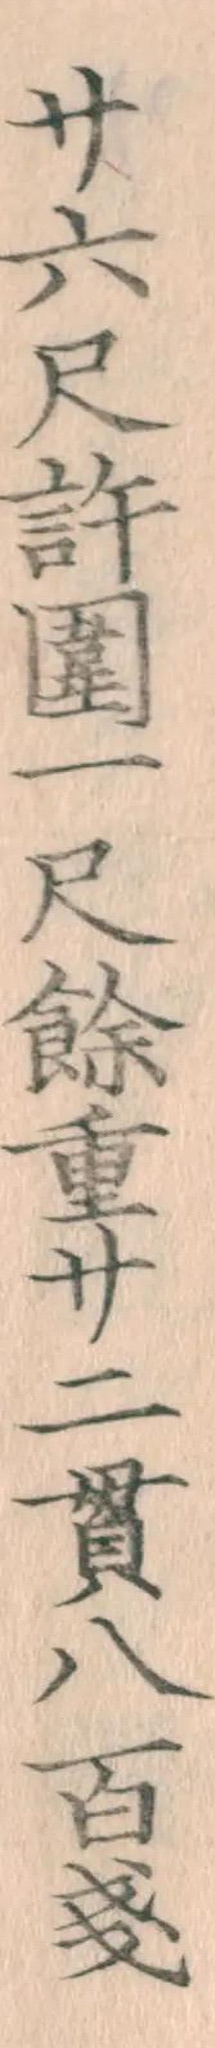サ六尺許囲一尺余重サ二貫八百戔
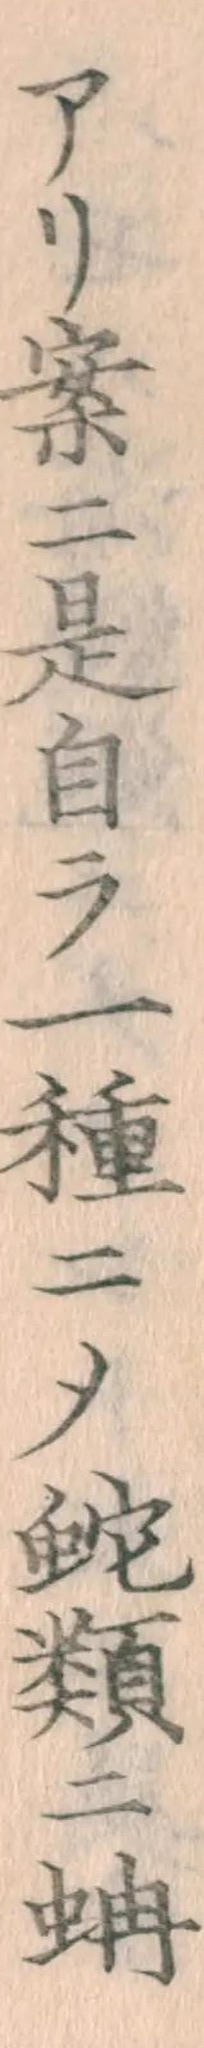アリ案ニ是自ラ一種ニシテ蛇類ニ蚺
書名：皇和魚譜 2巻
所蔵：国立国会図書館 National Diet Library, JAPAN
